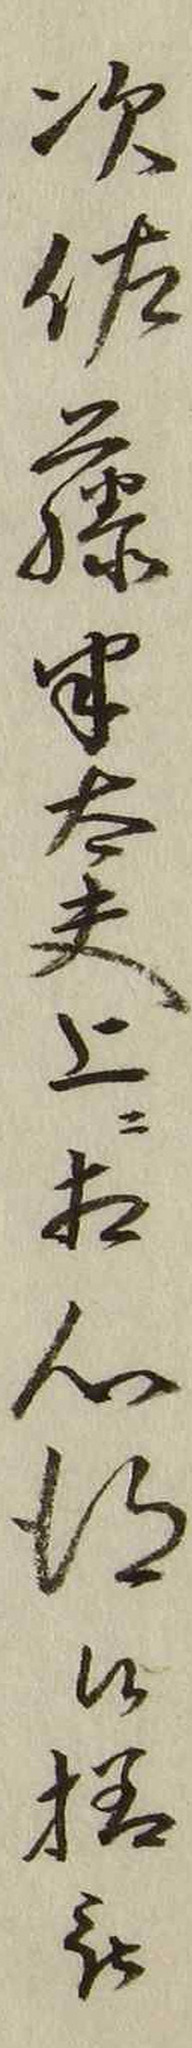次佐藤半太夫上ニ相心得候様被
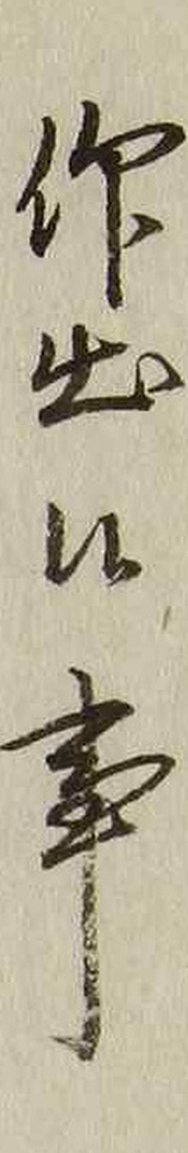仰出候事
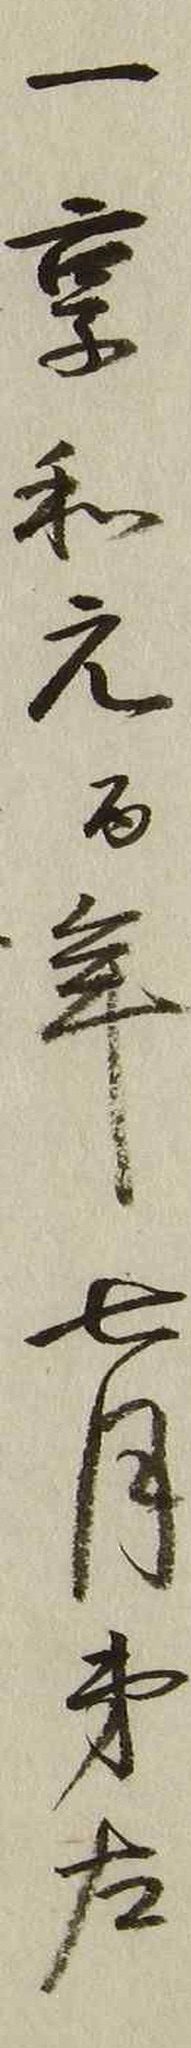一享和元酉年七月弟左
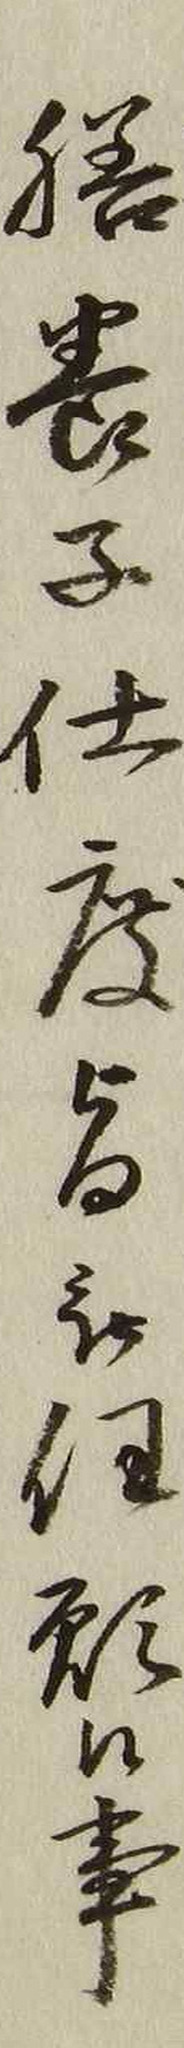膳養子仕度旨被任願候事
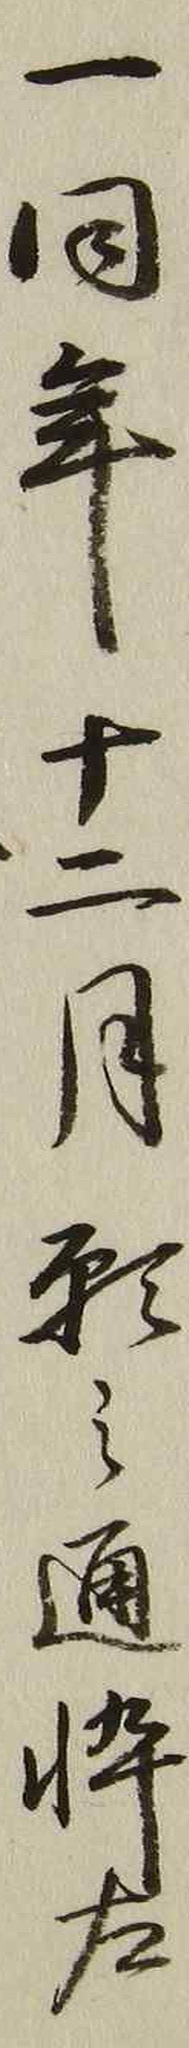一同年十二月願之通忰左
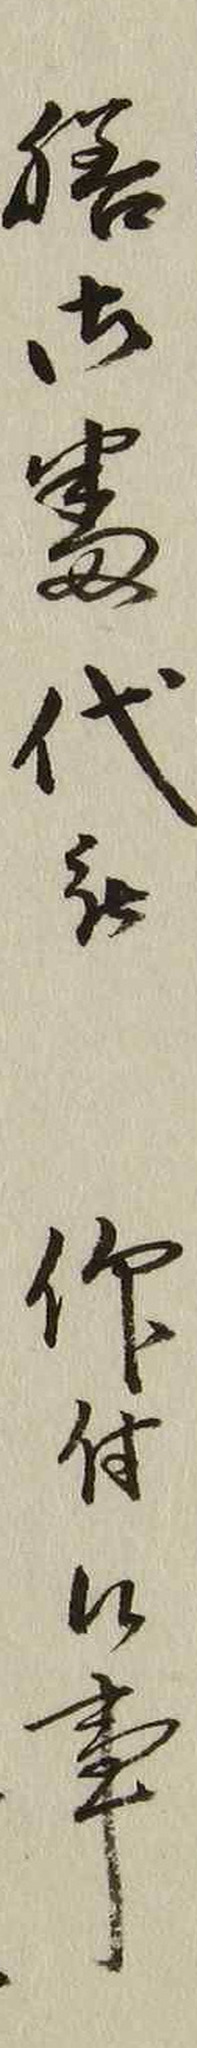膳御番代被仰付候事
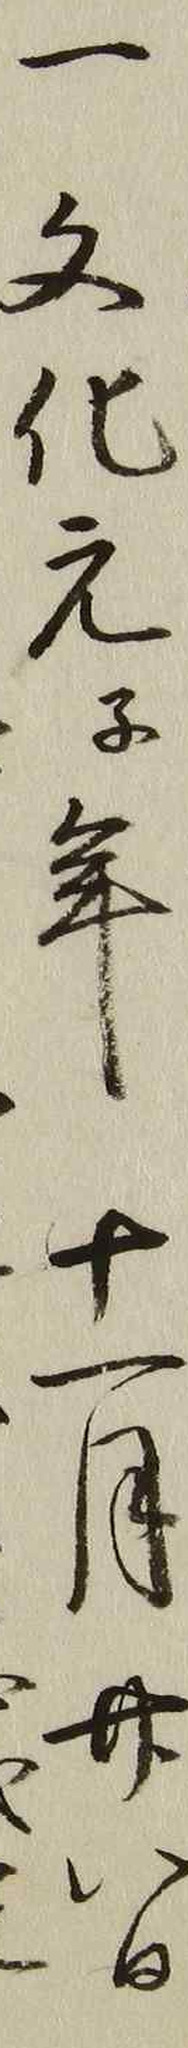一文化元子年十一月廿八日
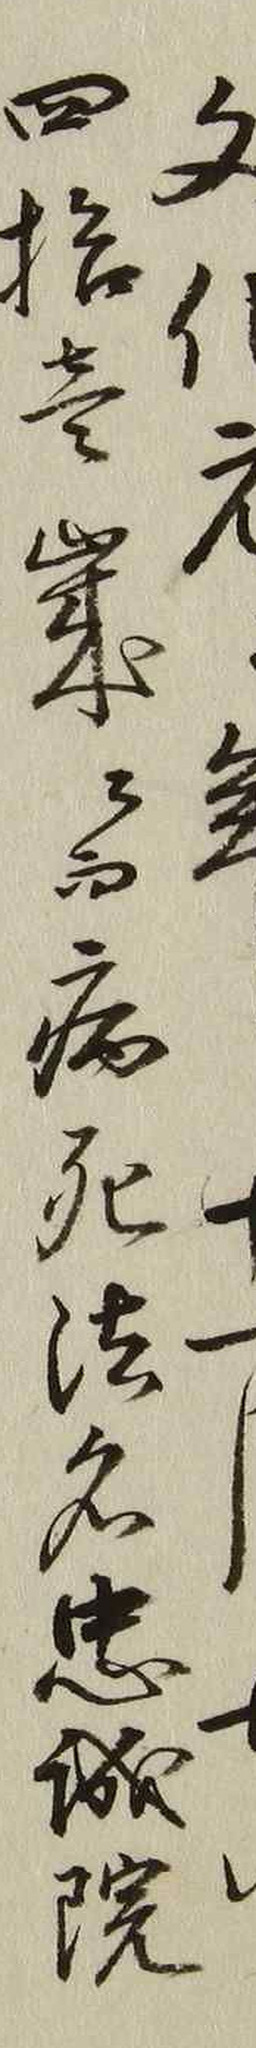四拾壱歳ニ而病死法名忠誠院
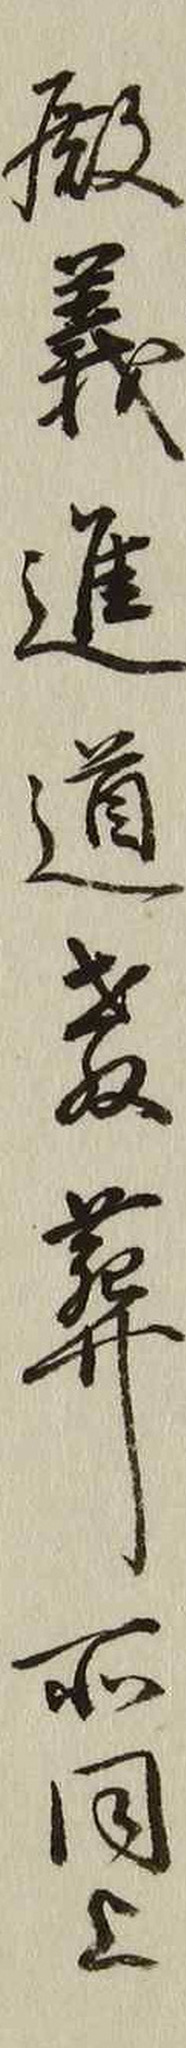殿義進道教葬所同上
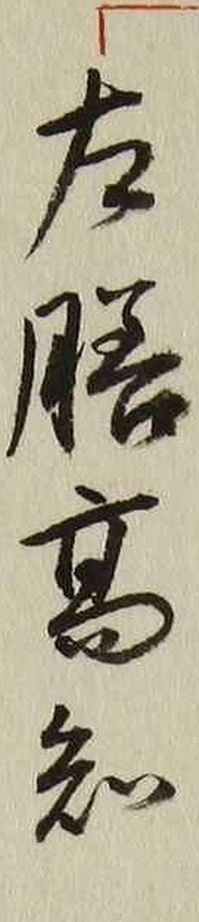左膳高知
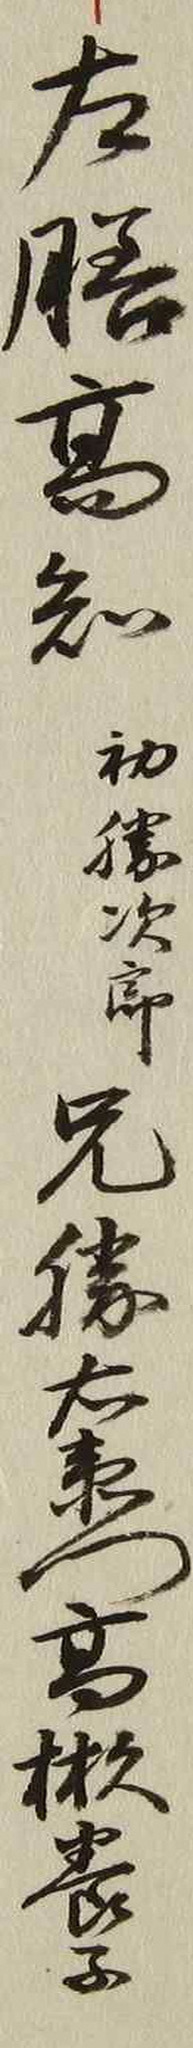左膳高知初勝次郎兄勝右衛門高彬養子
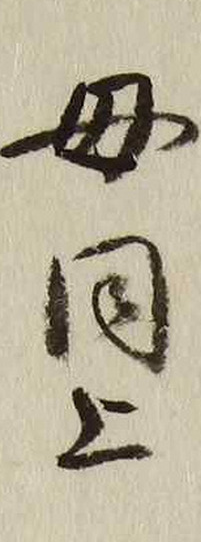母同上
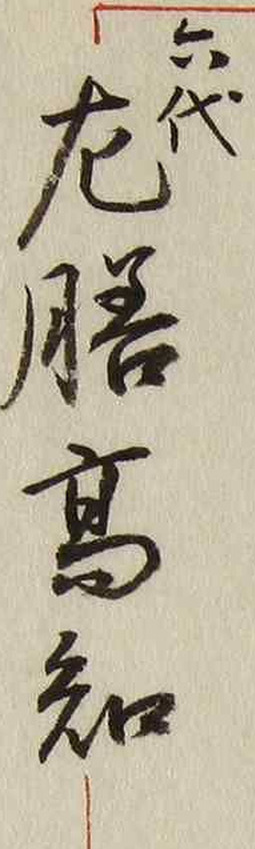左膳高知
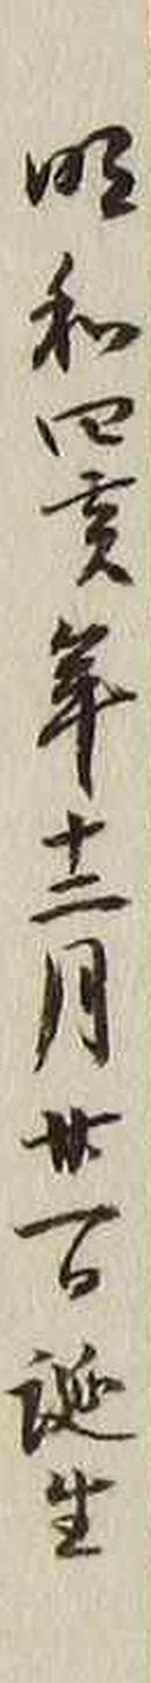明和四亥年十二月廿一日誕生
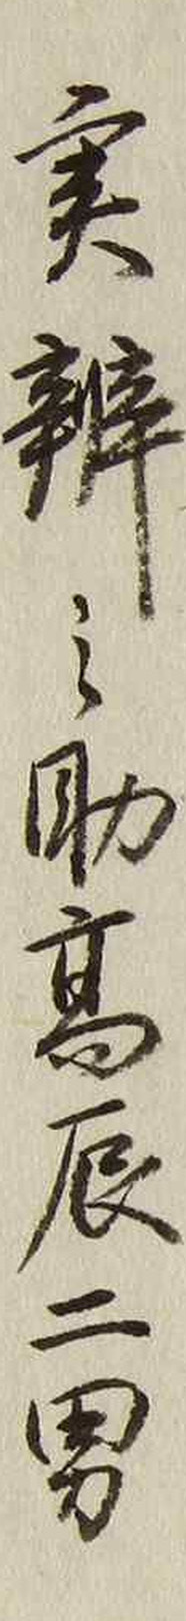実弁之助高辰二男
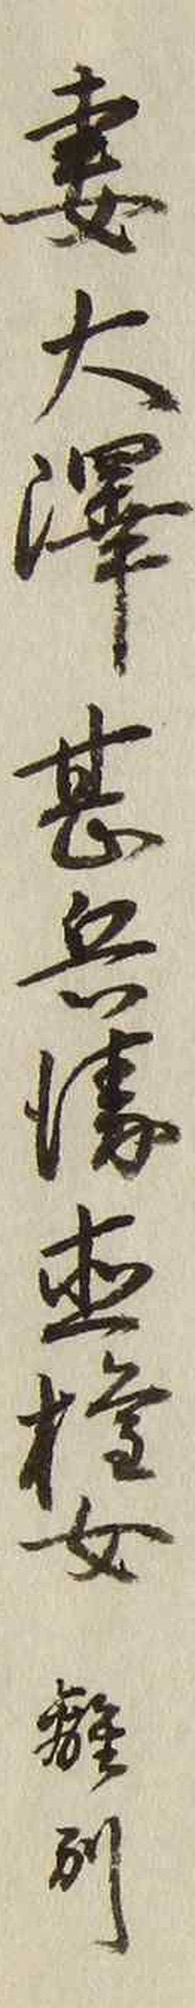妻大沢甚兵衛直権女離別
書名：諸士系譜　巻之136　た之部12
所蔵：会津若松市立会津図書館
